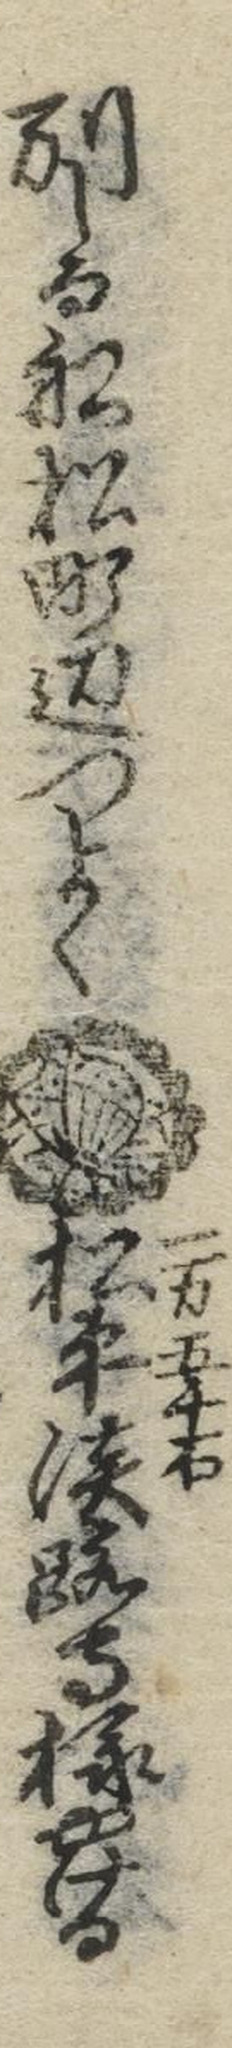別し而船松町辺つよく松平淡路守様やける
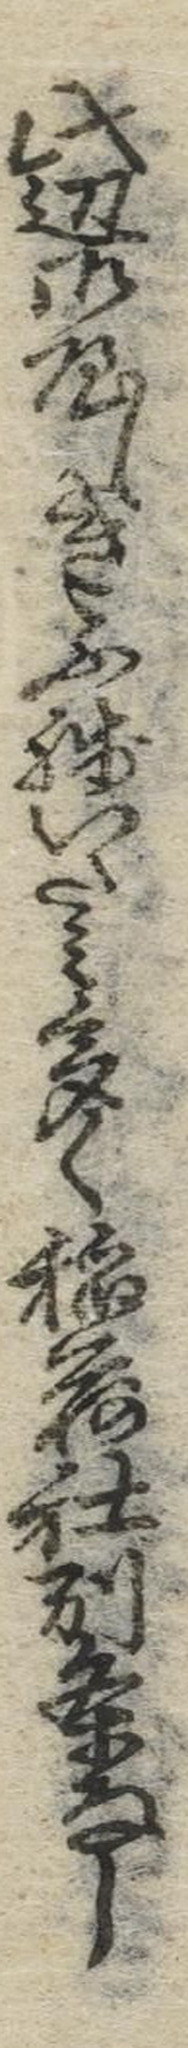此辺御やしき不残いたミ多く稲荷社別条なし
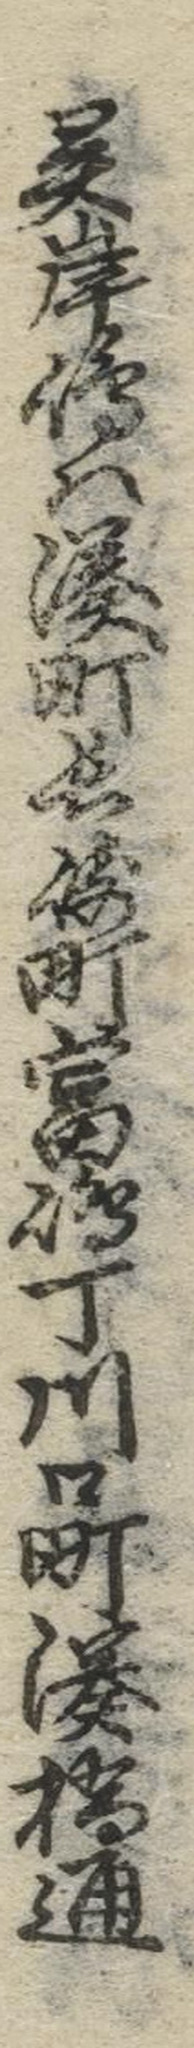霊岸嶋ハ湊町長崎町富嶋丁川口町湊橋通
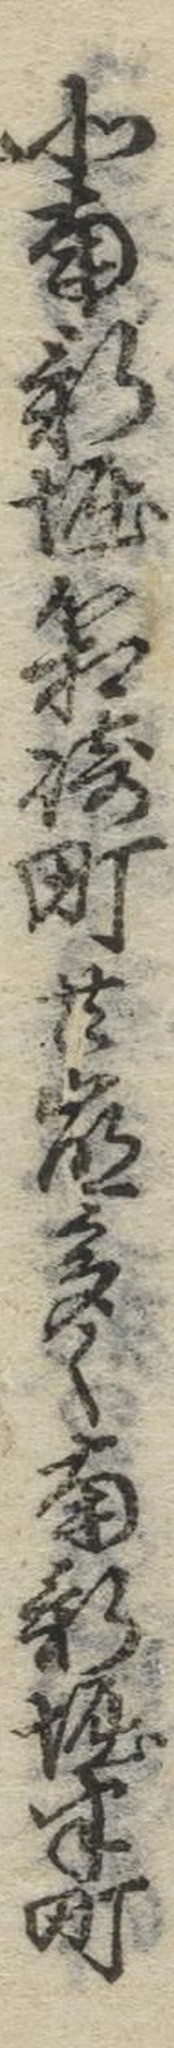北南新堀箱崎町共崩多く南新堀半町
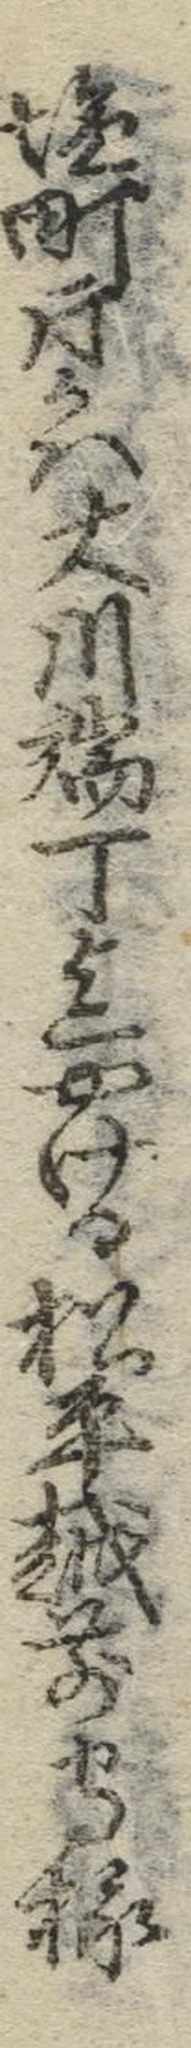塩町片かハ大川端丁迄やける松平越前守様
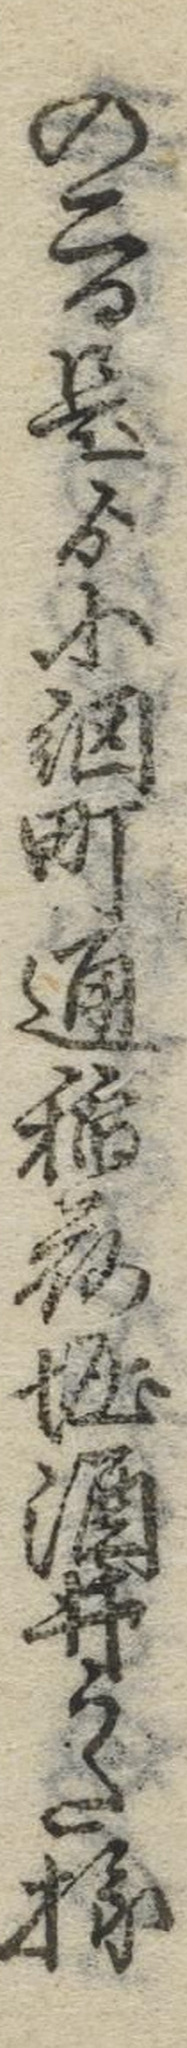のこる是ゟ小網町通稲荷堀酒井うた様
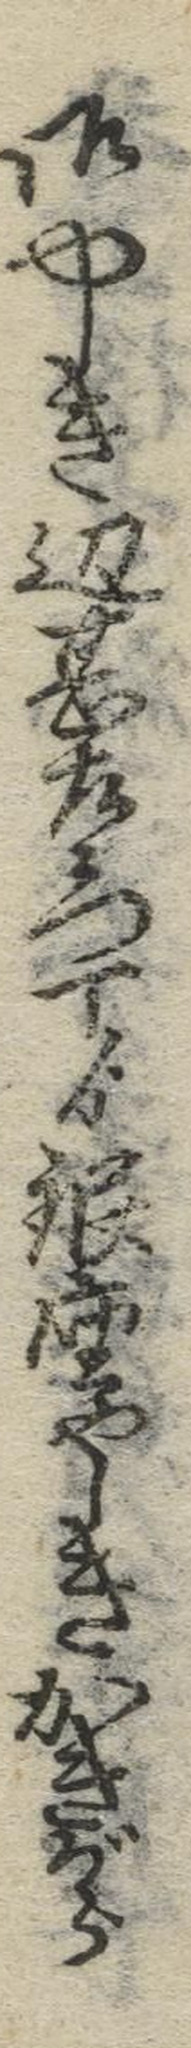御やしき辺甚左衛門丁ゟ銀座やしきかきがら
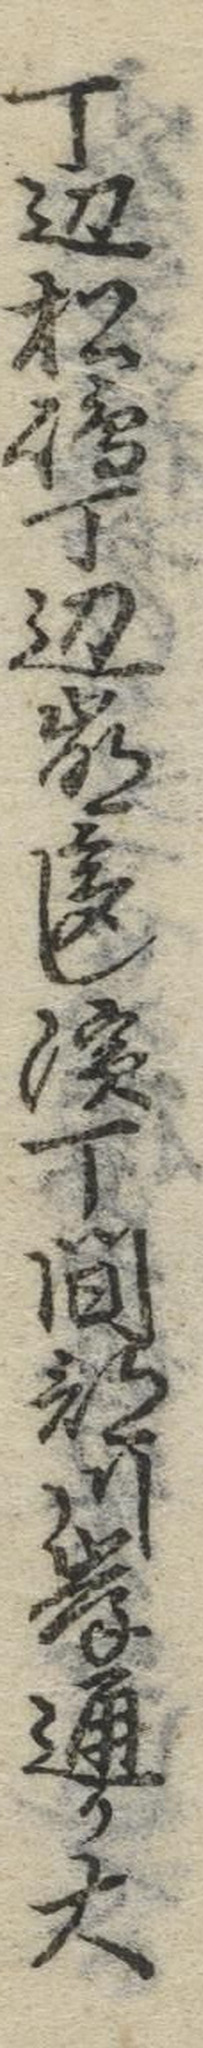町辺松嶋丁辺崩多し濱丁間部川岸通り大
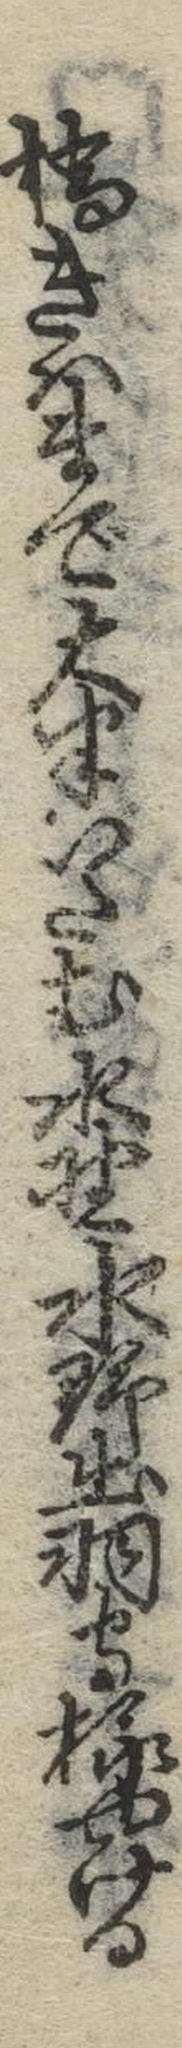橋きハまで大半いたむ水野水野出羽守様やける
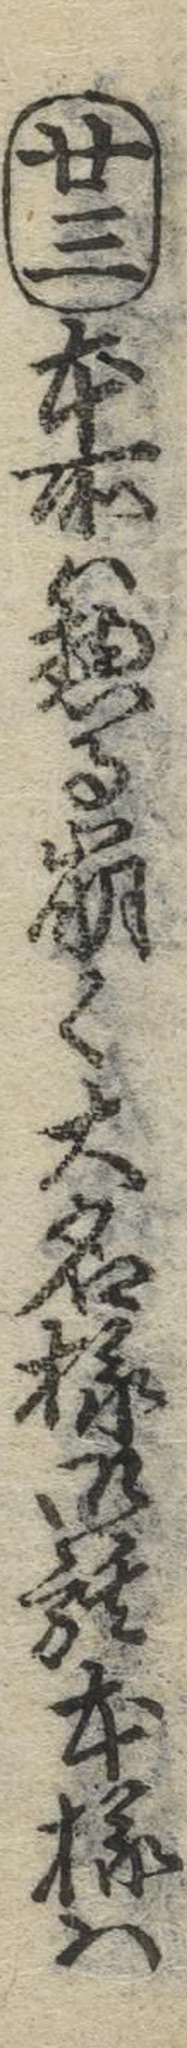廿三本所ハ惣而崩く大名様御旗本様ハ
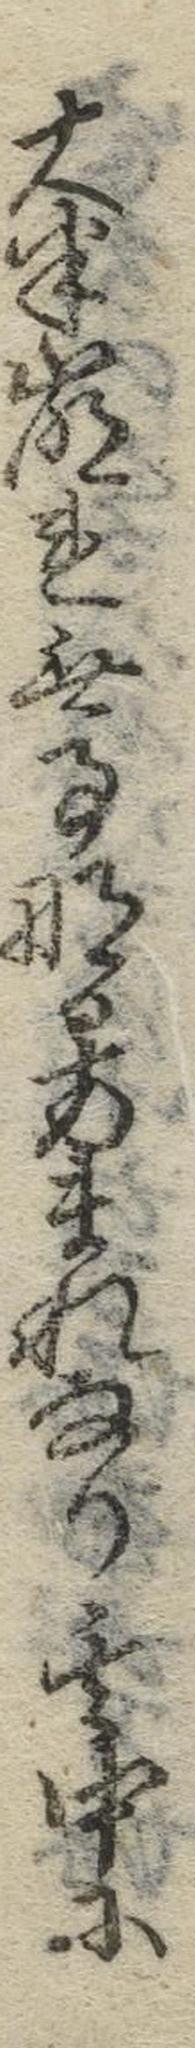大半崩れ無事なる方まれなり其中に
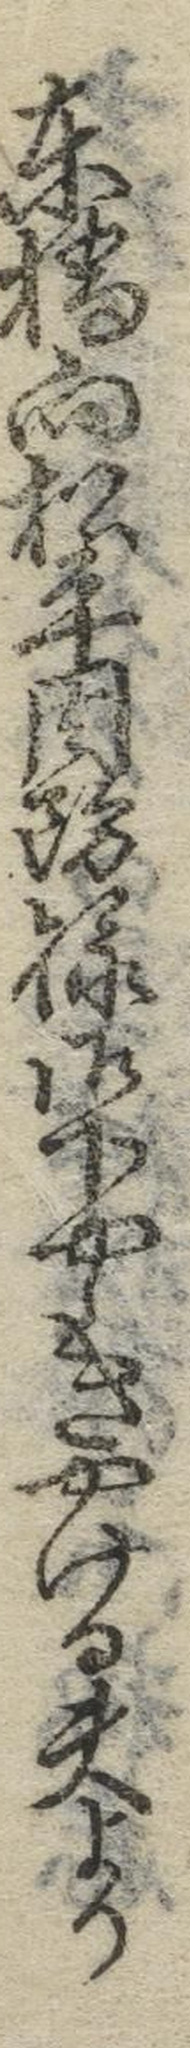東橋向松平周防様御下やしきやける夫より
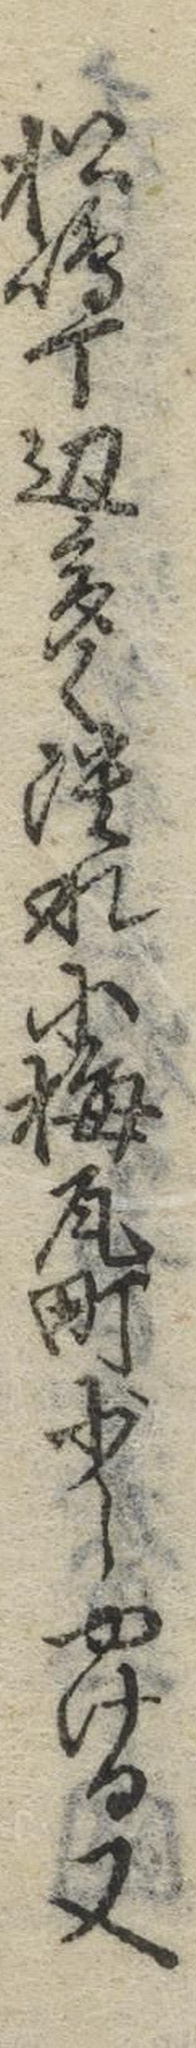松嶋丁辺多く潰れ小梅瓦町少しやける又
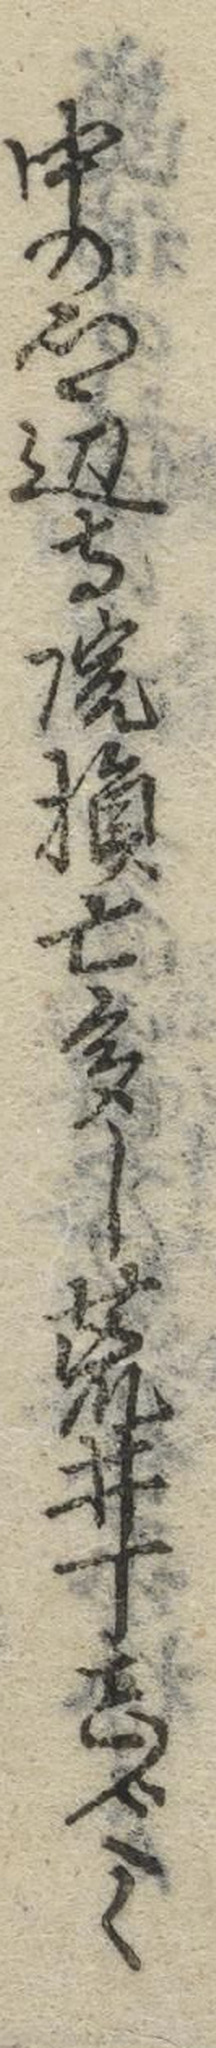中の郷辺寺院損亡多し荒井丁しごく
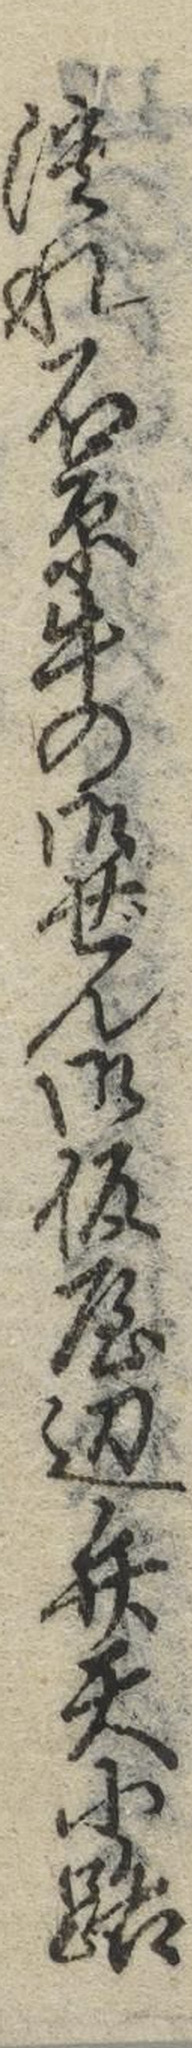潰れ石原牛の御ぜん御仮屋辺弁天小路
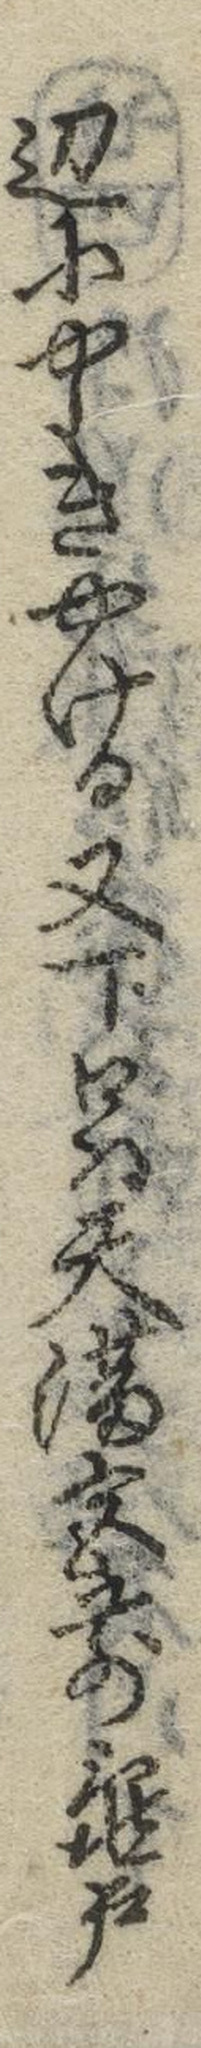辺にやしきやける又一ト口ハ天満宮前亀戸
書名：江戸御屋鋪方町方共　地震類焼場所巨細書之寫　潰家潰土蔵共取調附街道筋近在迄
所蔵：東京大学地震研究所図書室 Earthquake Research Institute Library, The University of Tokyo, JAPAN
